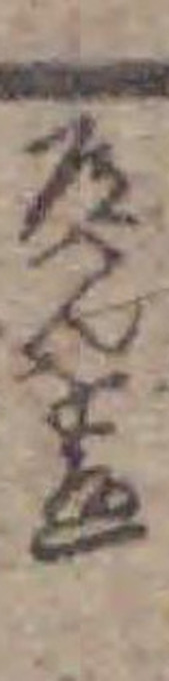道へんを過
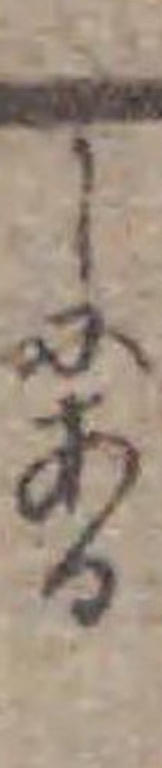しにある
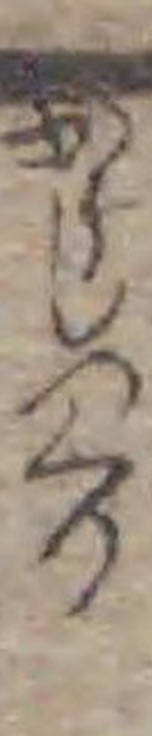かうしつくり
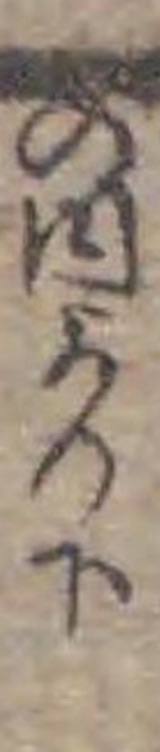の内より下
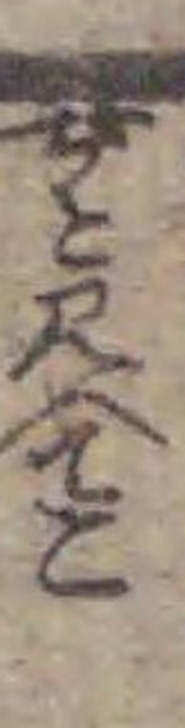女と見へてこ
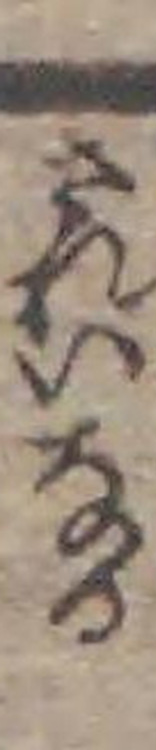きれいなる
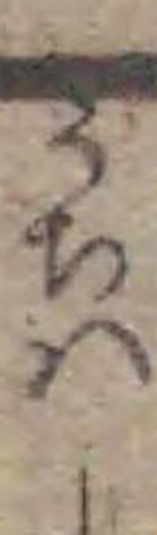うちは
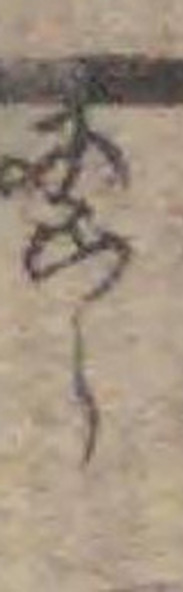にほし
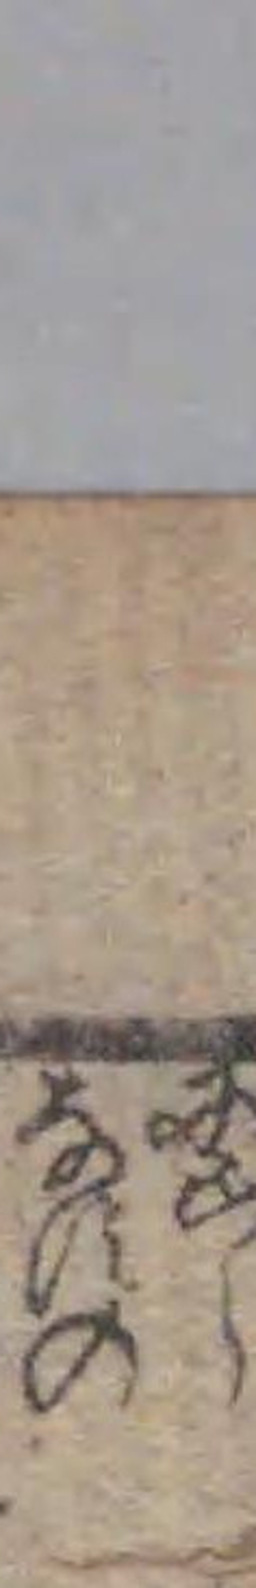なすの
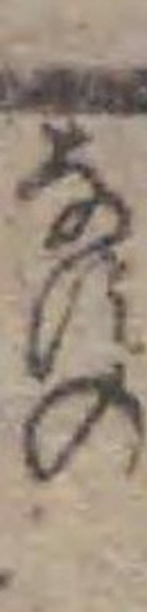なすの
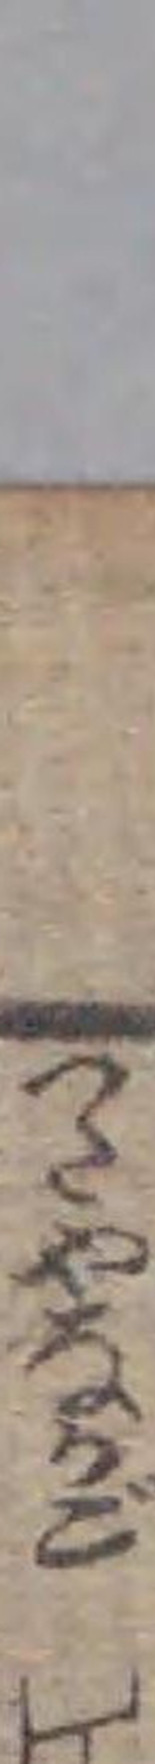へたやなかご
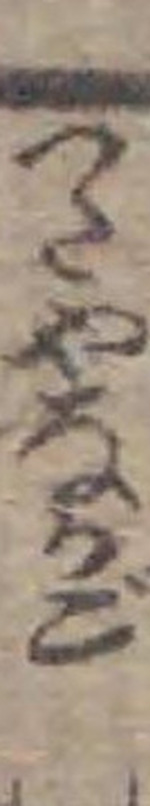へたやなかご
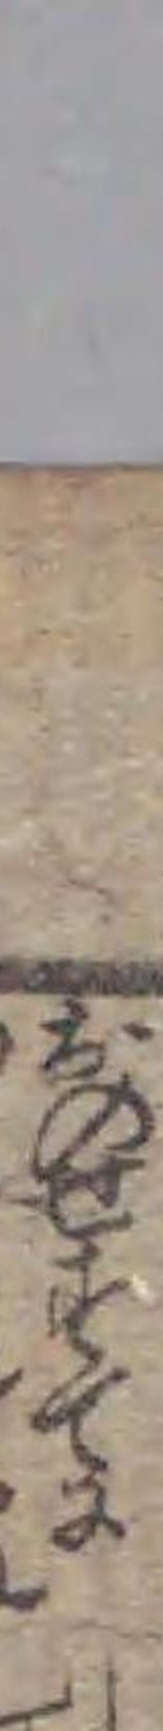おのせすてに
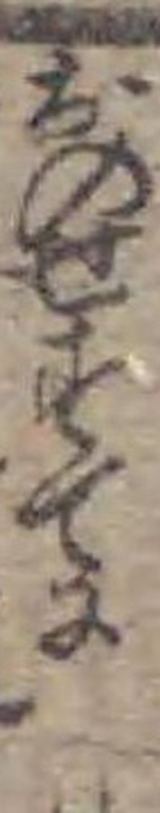おのせすてに
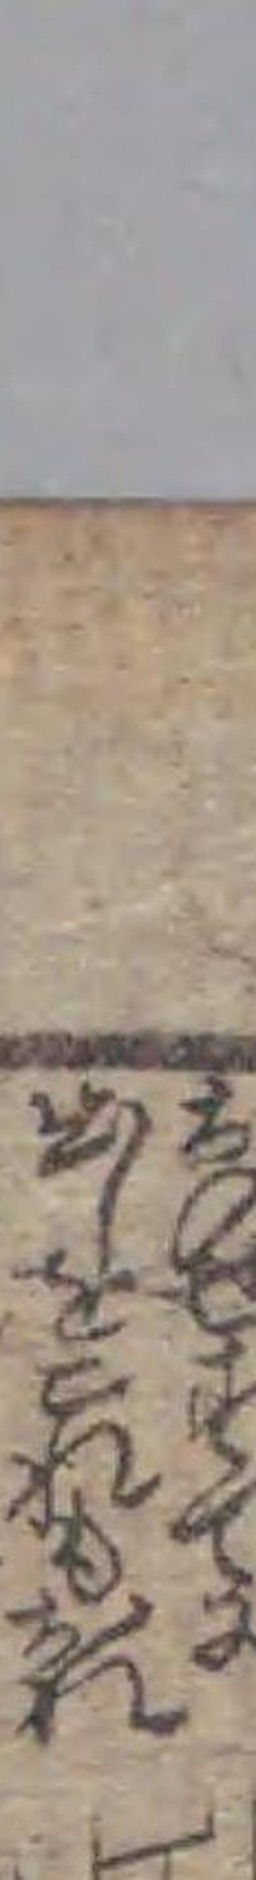出しをこれもおれ
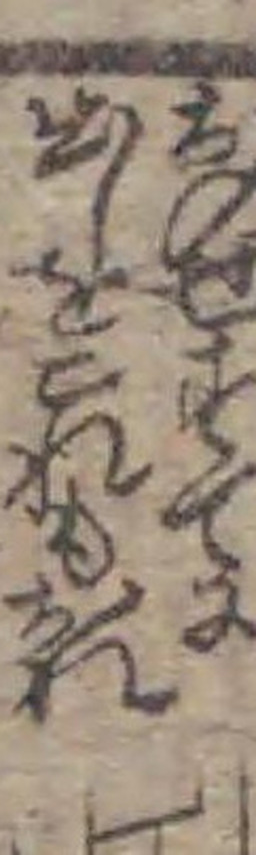出しをこれもおれ
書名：通風伊勢物語 : 3巻
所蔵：国立国会図書館 National Diet Library, JAPAN
